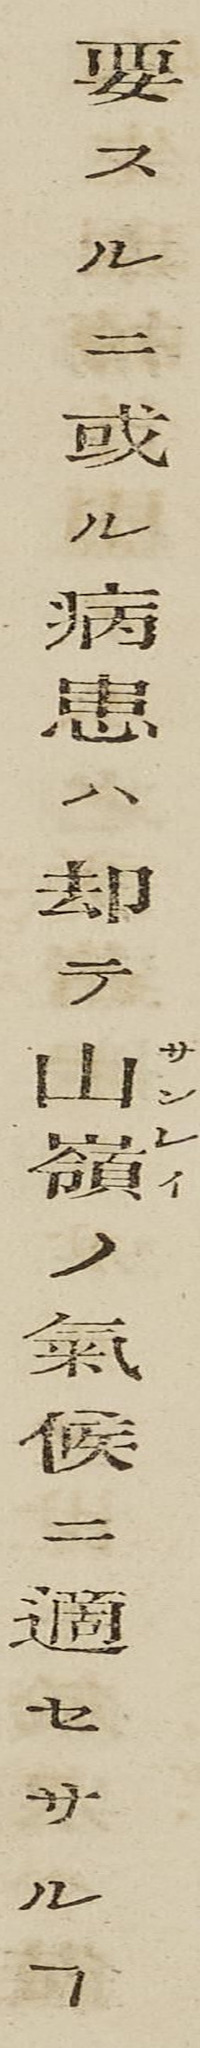要スルニ或ル病患ハ却テ山嶺ノ気候ニ適セサルコト
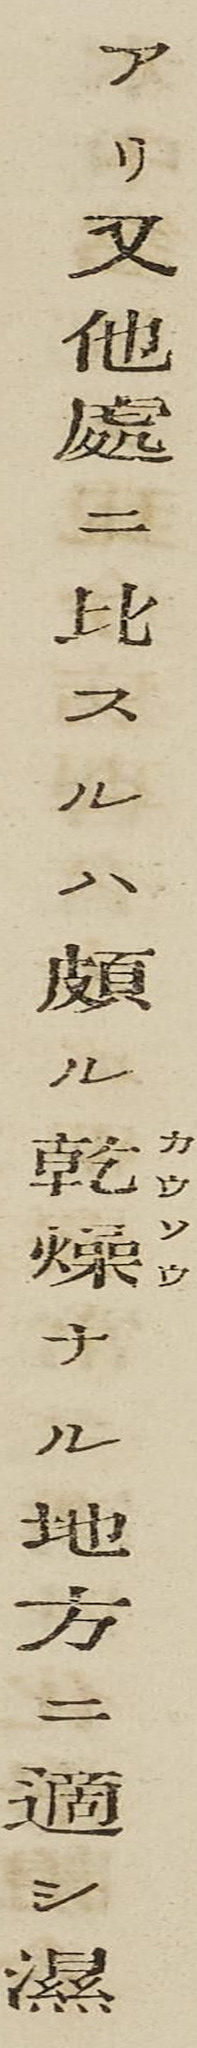アリ又他処ニ比スルハ頗ル乾燥ナル地方ニ適シ湿
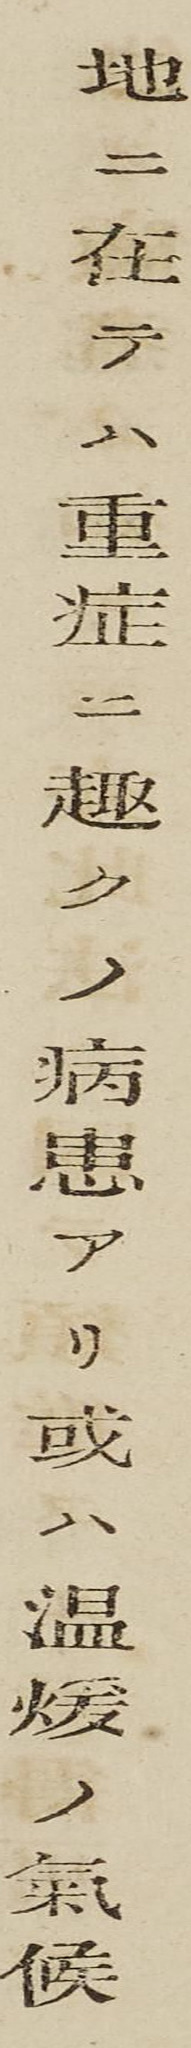地ニ在テハ重症ニ趣クノ病患アリ或ハ温煖ノ気候
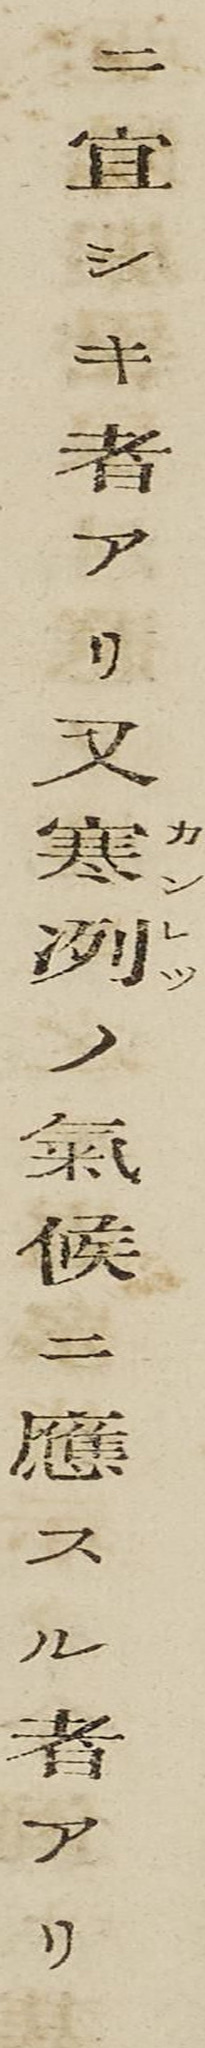ニ宣シキ者アリ又寒冽ノ気候ニ応スル者アリ
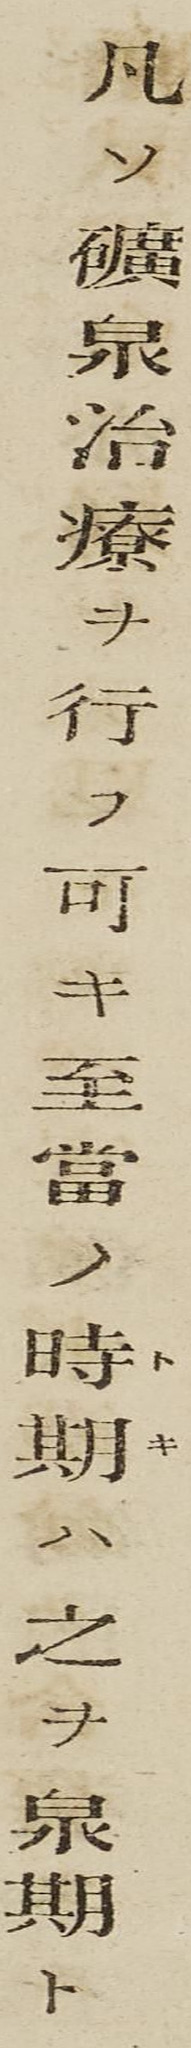凡ソ礦泉治療ヲ行フ可キ至当ノ時期ハ之ヲ泉期ト
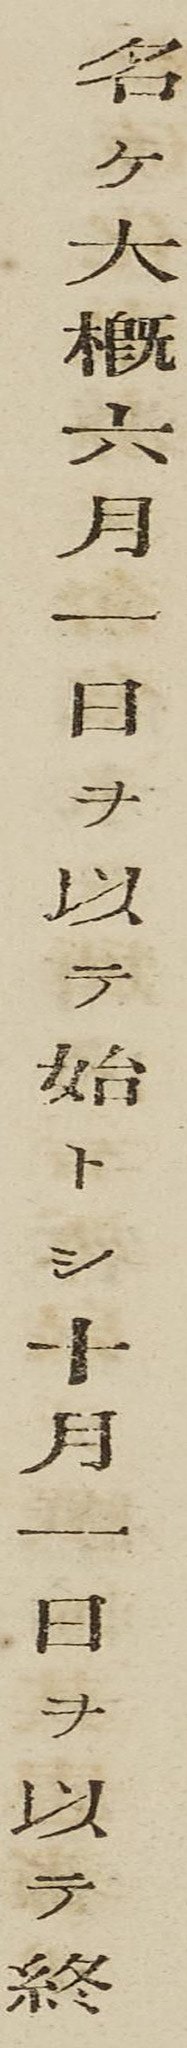名ケ大概六月一日ヲ以テ始トシ十月一日ヲ以テ終
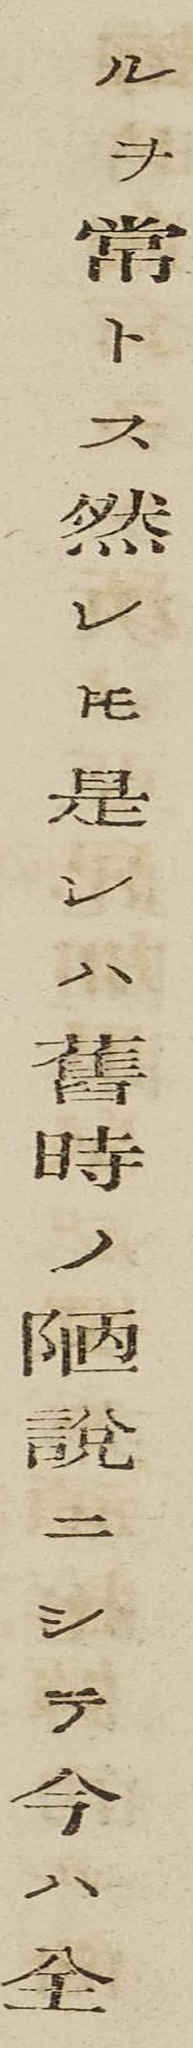ルヲ常トス然レトモ是レハ旧時ノ陋説ニシテ今ハ全
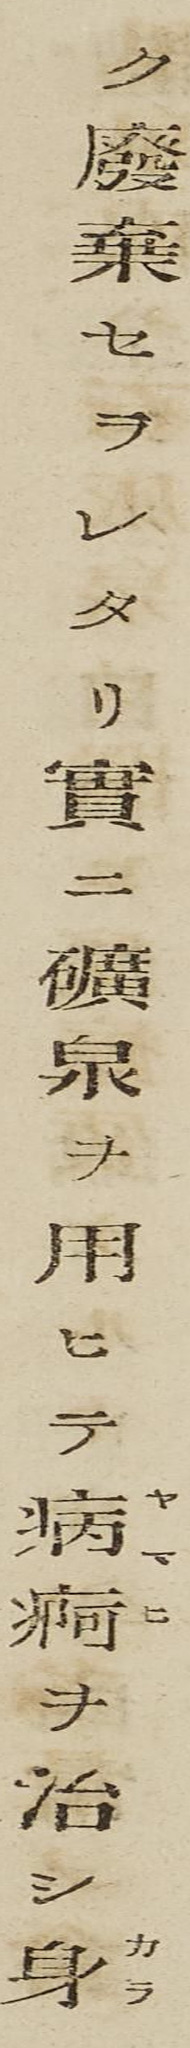ク廃棄セラレタリ実ニ礦泉ヲ用ヒテ病痾ヲ治シ身

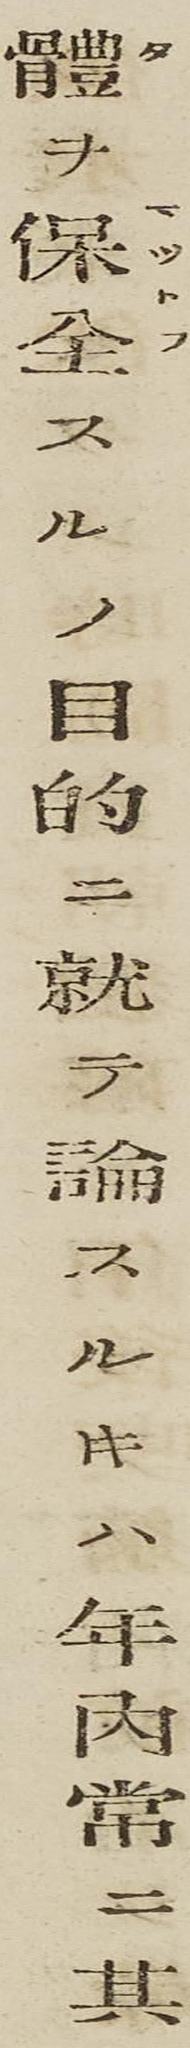体ヲ保全スルノ目的ニ就テ論スルトキハ年内常ニ其
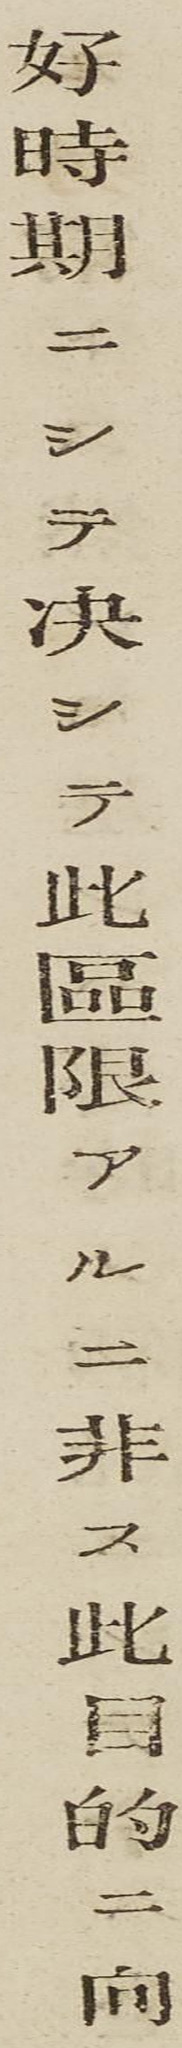好時期ニシテ決シテ此区限アルニ非ス此目的ニ向
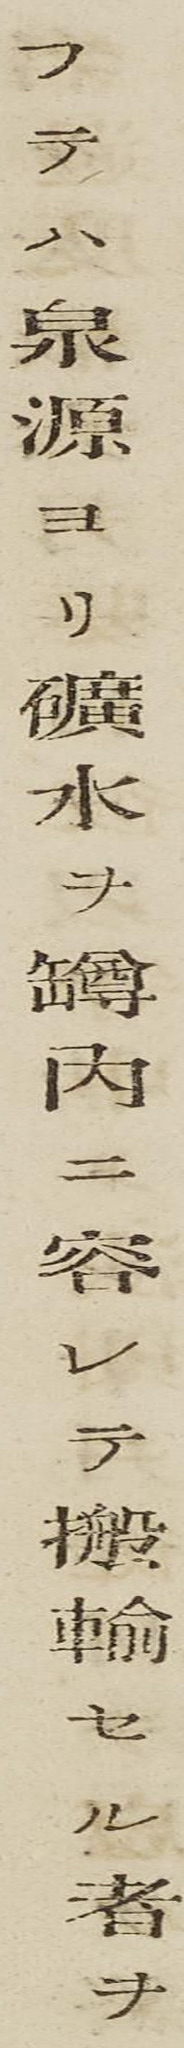フテハ泉源ヨリ礦水ヲ罇内ニ容レテ搬輸セル者ヲ
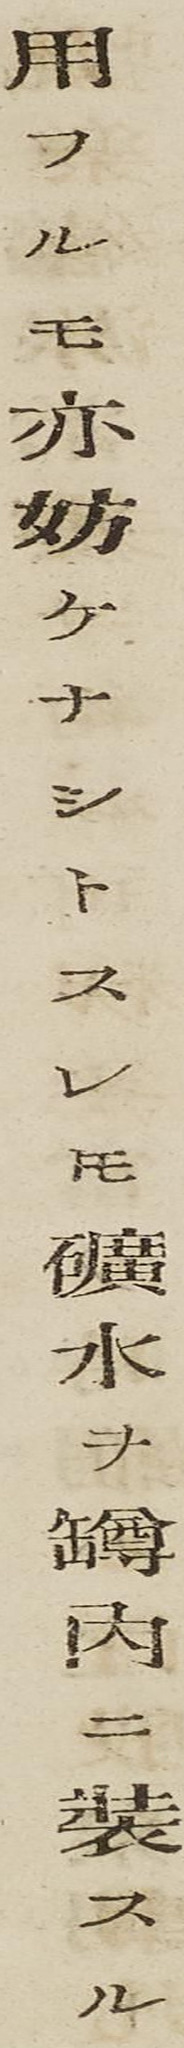用フルモ亦妨ケナシトスレトモ礦水ヲ罇内ニ装スル
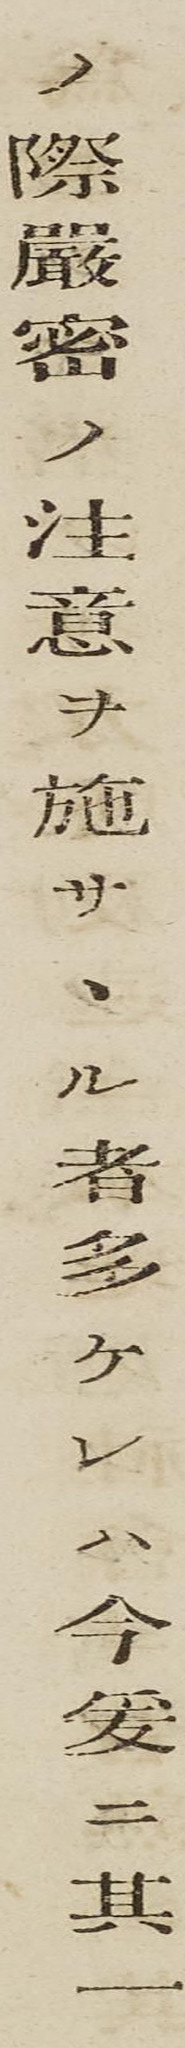ノ際厳密ノ注意ヲ施サヽル者多ケレハ今爰ニ其一
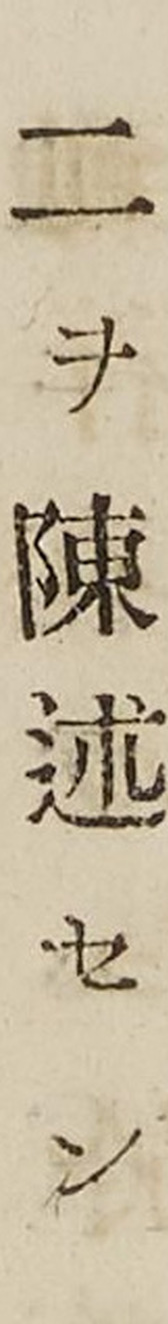二ヲ陳述セン
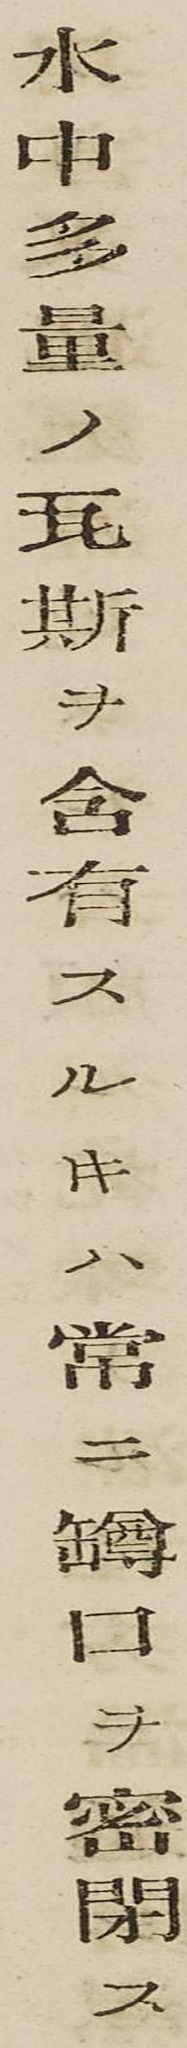水中多量ノ瓦斯ヲ含有スルトキハ常ニ罇口ヲ密閉ス
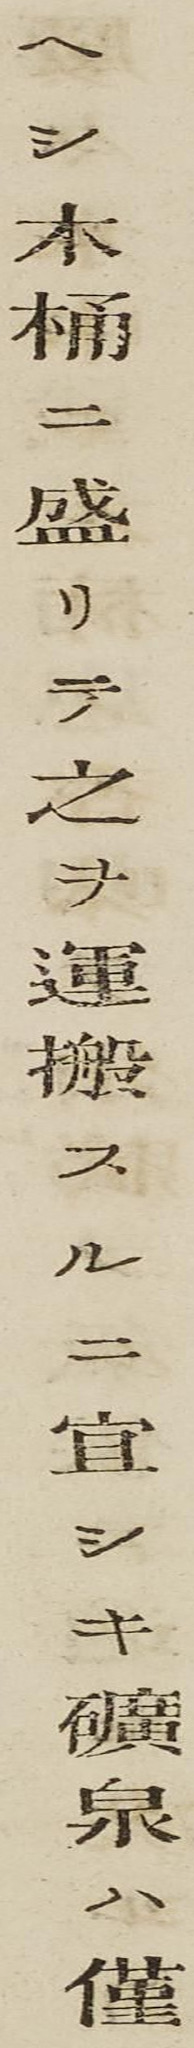ヘシ木槽ニ盛リテ之ヲ運搬スルニ宣シキ礦泉ハ僅
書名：日本温泉考
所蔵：東京大学地震研究所図書室 Earthquake Research Institute Library, The University of Tokyo, JAPAN
